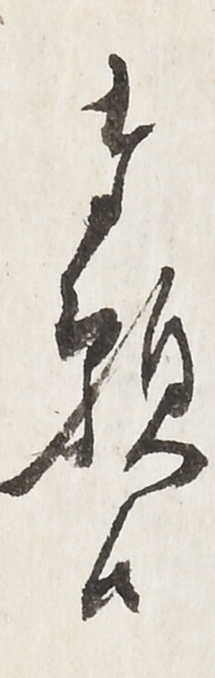奉願候
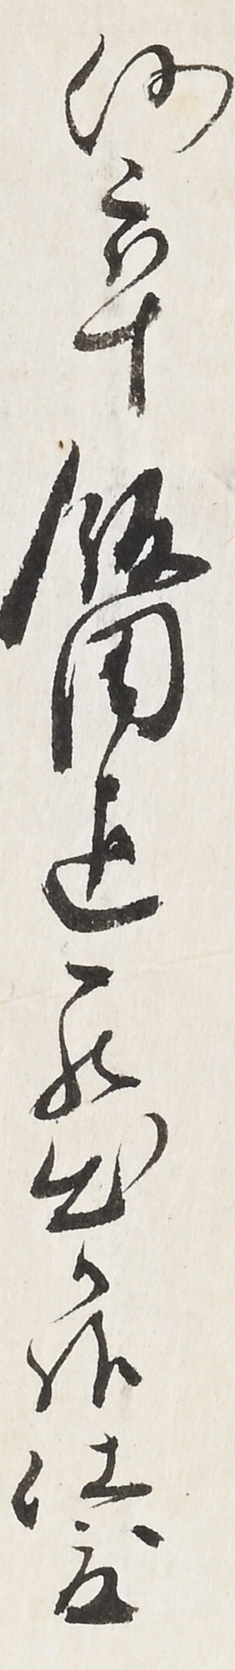何卒飯田迄罷出候様仕度

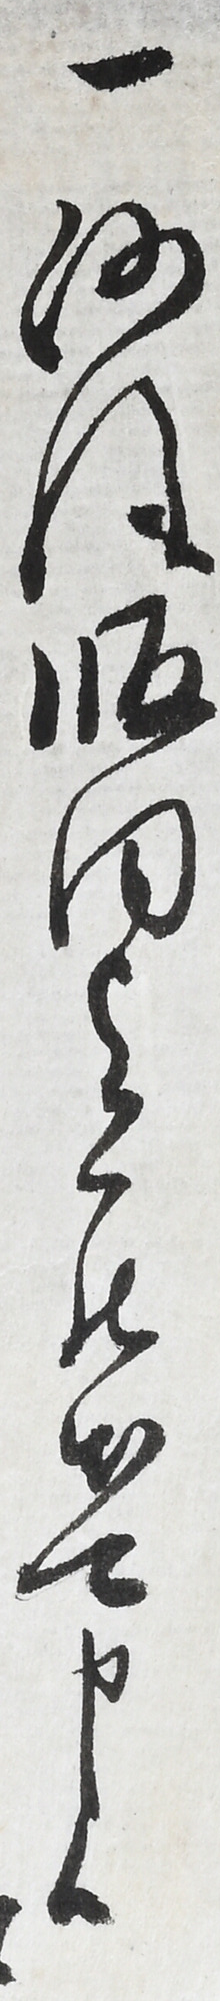一何様飯田迄罷出可申候と
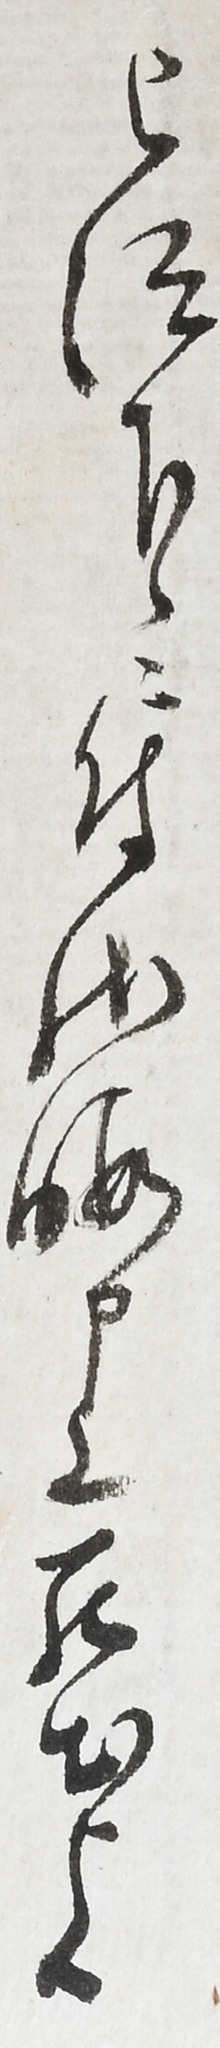被仰下候ニ付御暇申上罷出申候
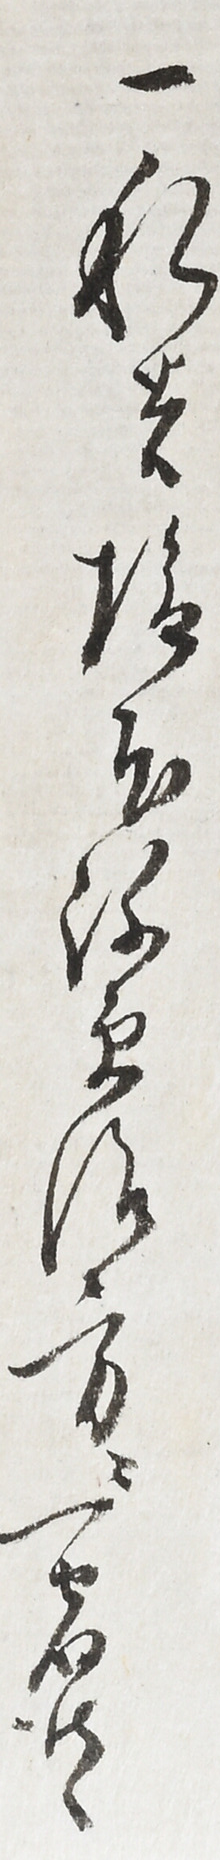一私共塩屋弥平治方ニ一宿仕候
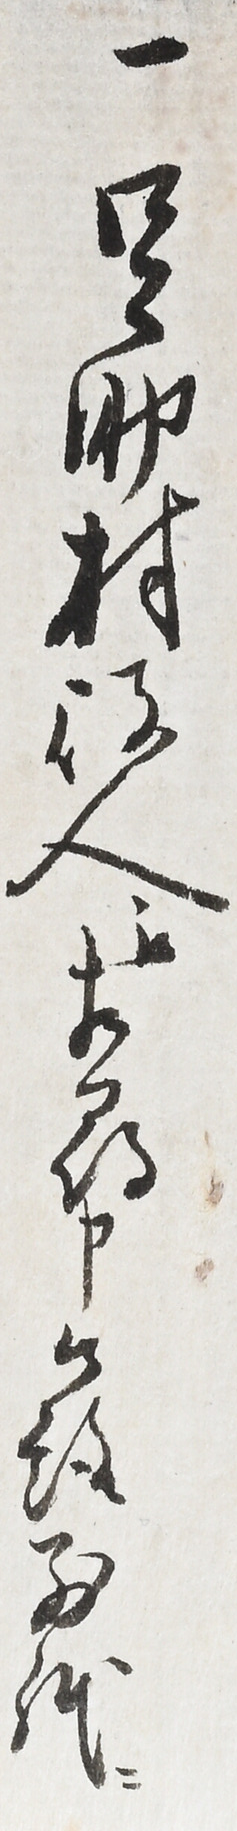一足助村役人え相尋申候趣別紙ニ
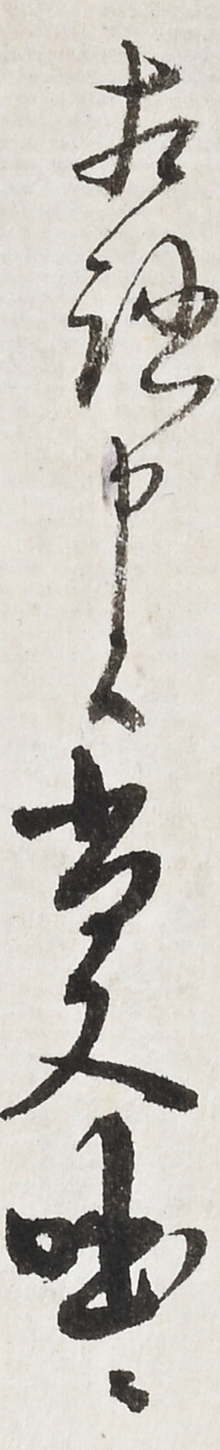相認申候尚又咄ニ
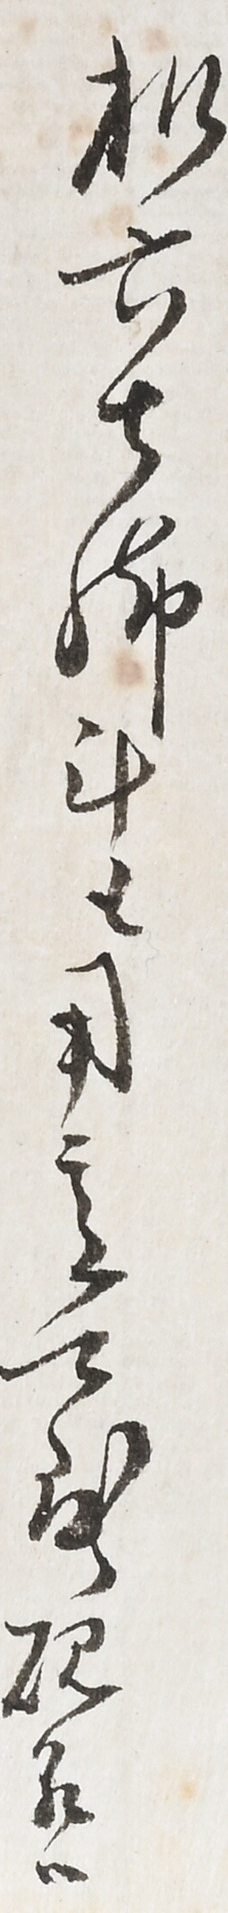机六七脚斗も用意可致候硯箱ハ
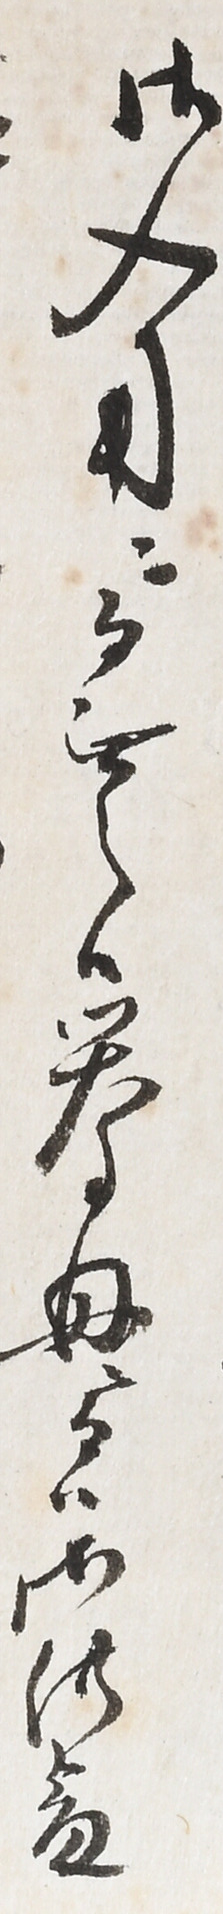御入用ニ而無之候挙母ニ而ハ御供番
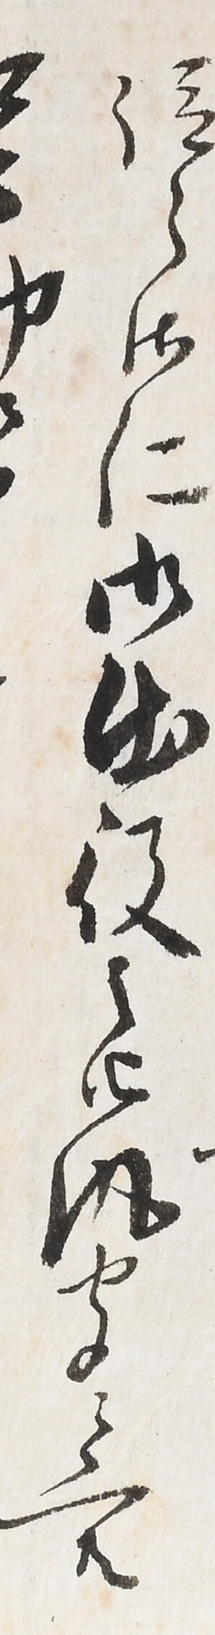位之御仁御出役之由風聞ニ候へ共
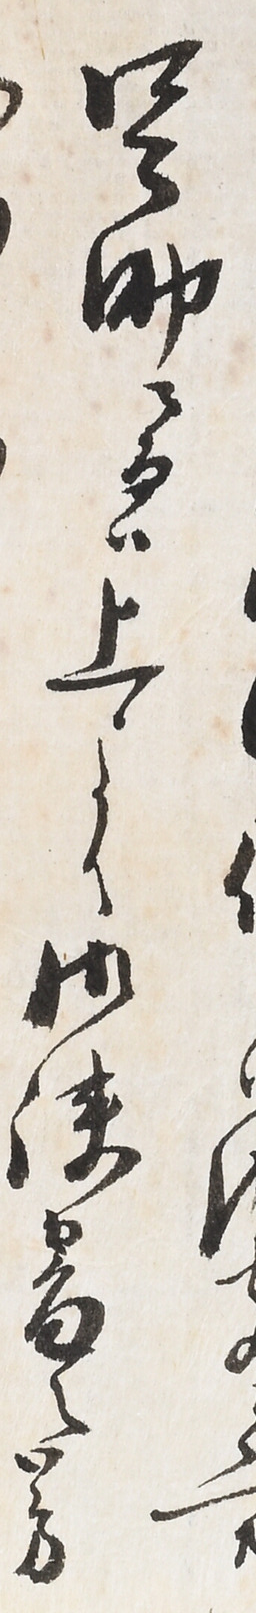足助ニ而ハ上より御使番之御方
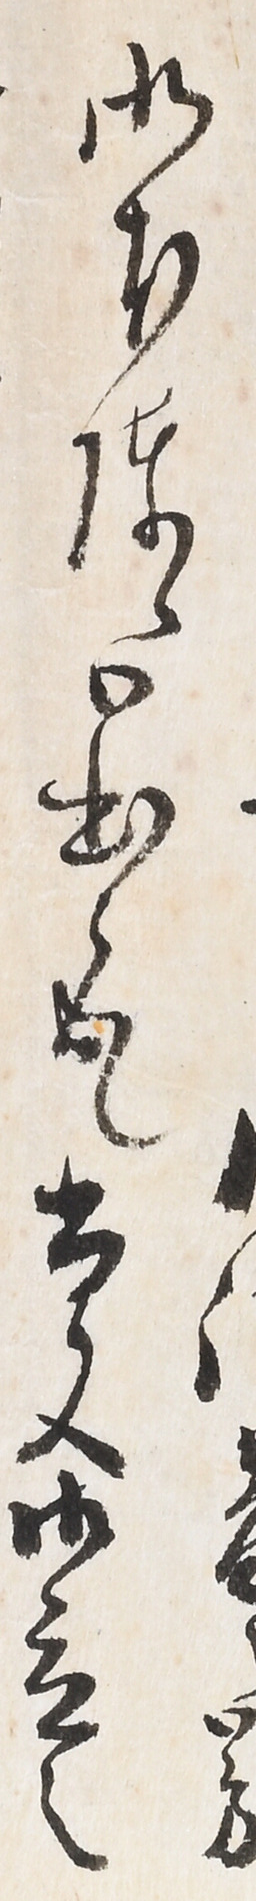御本陣へ御出被成候尚又御立之
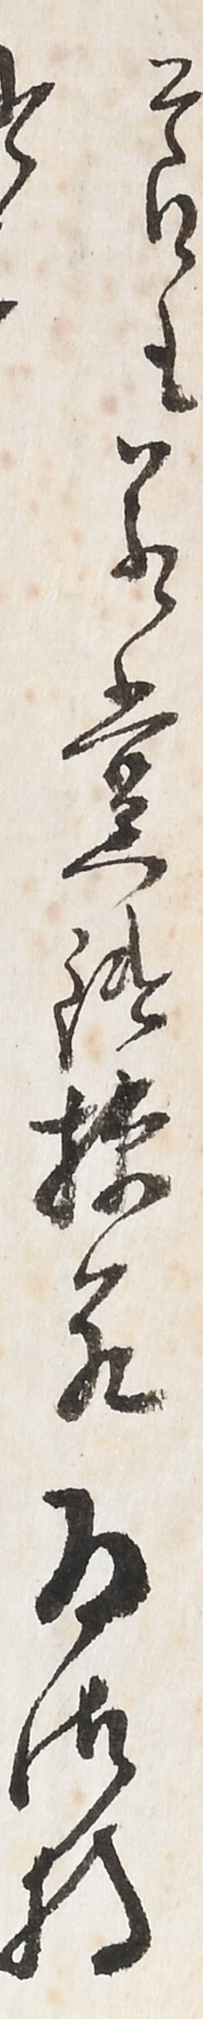節も若党鑓挟箱為御持
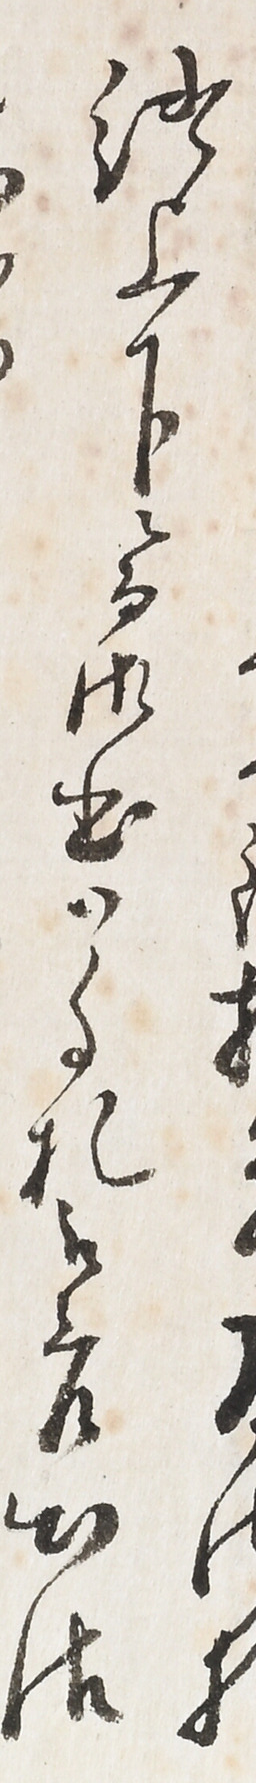継上下ニ而御出御手札被差出御
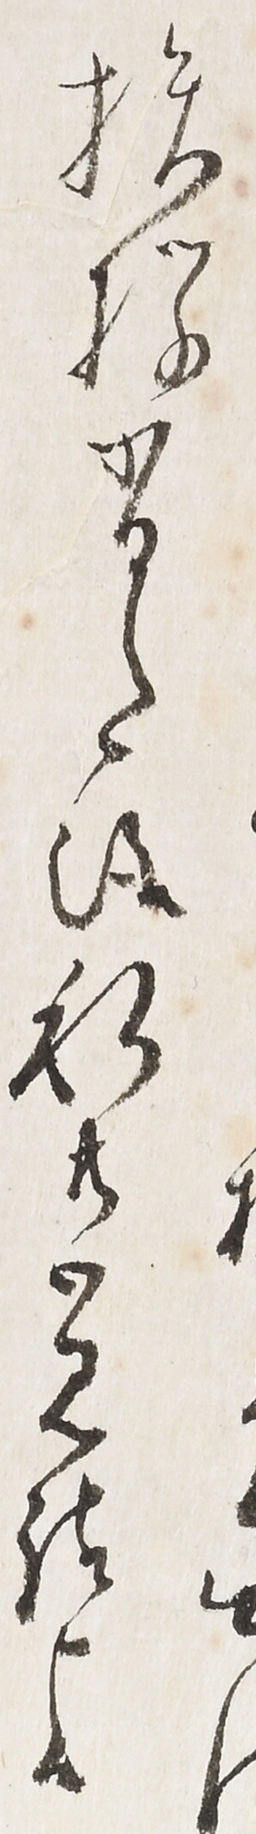挨拶有之候趣私共御見請申候
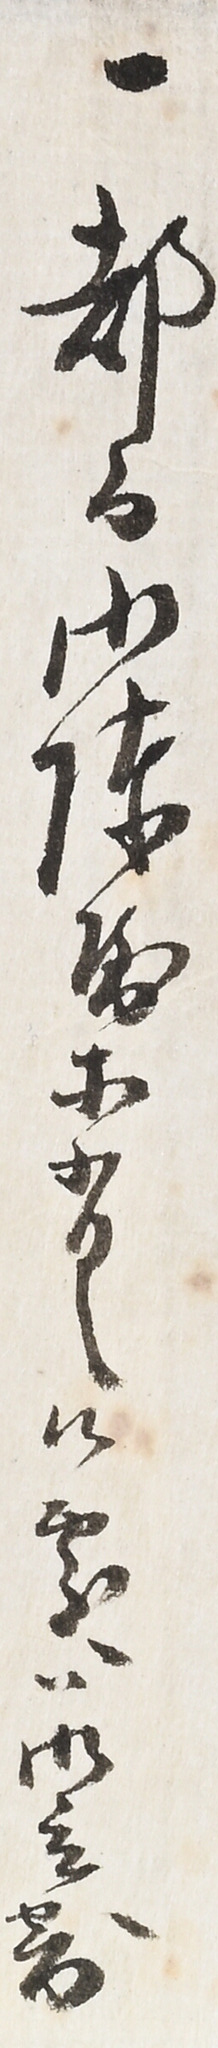一都而御陣屋等有之候處へハ御立寄
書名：御測量方御出ニ付三州迄罷出御窺聞合覚書
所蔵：伊那市立高遠町図書館・合同会社AMANE
